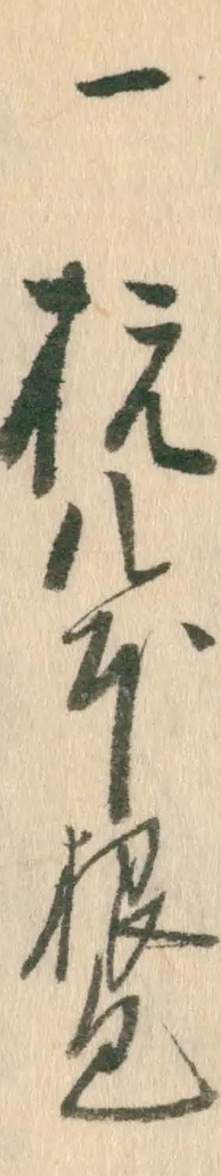一杭八本根包
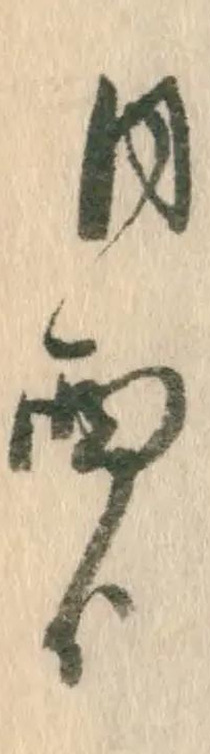内西ゟ

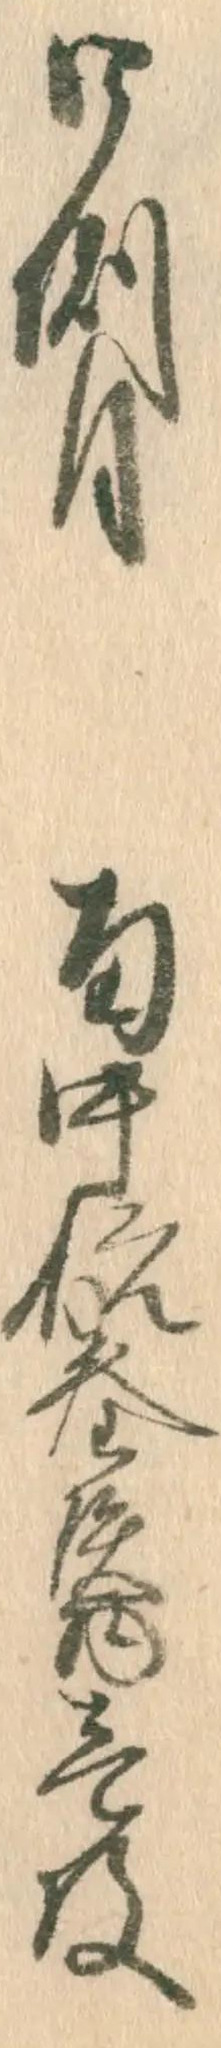四側目南中杭巻鉄物壱枚
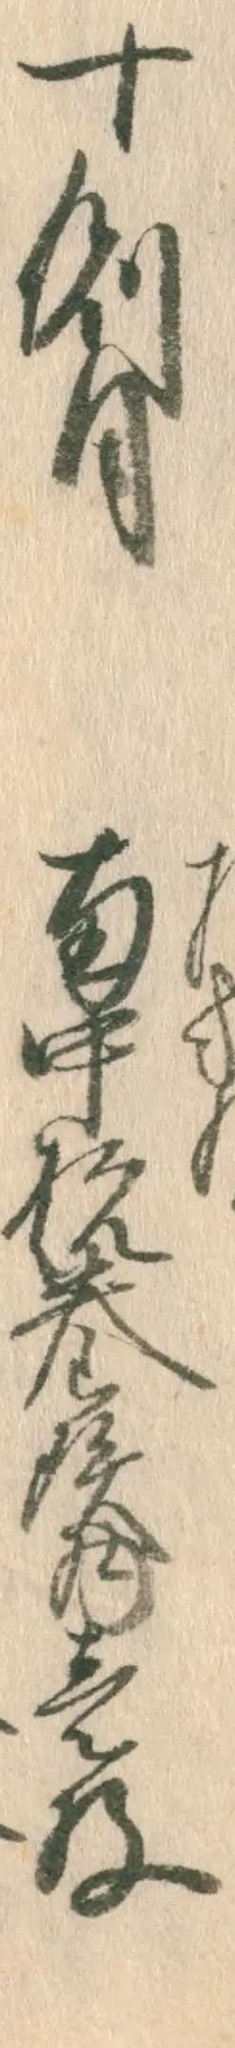十側目南中杭巻鉄物壱枚
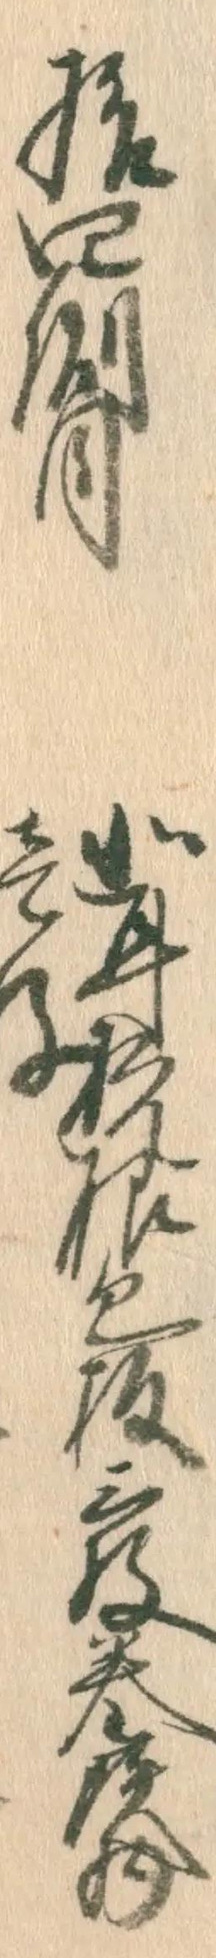拾四側目北耳杭根包板三枚巻鉄物壱枚
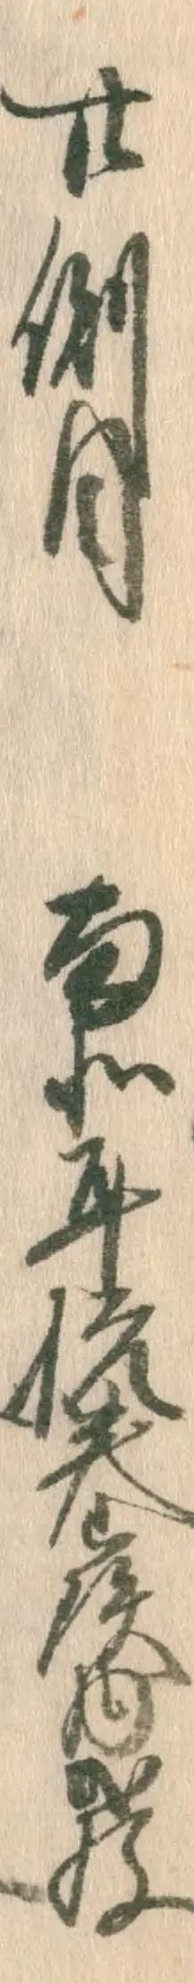廿側目南北耳杭巻鉄物弐枚
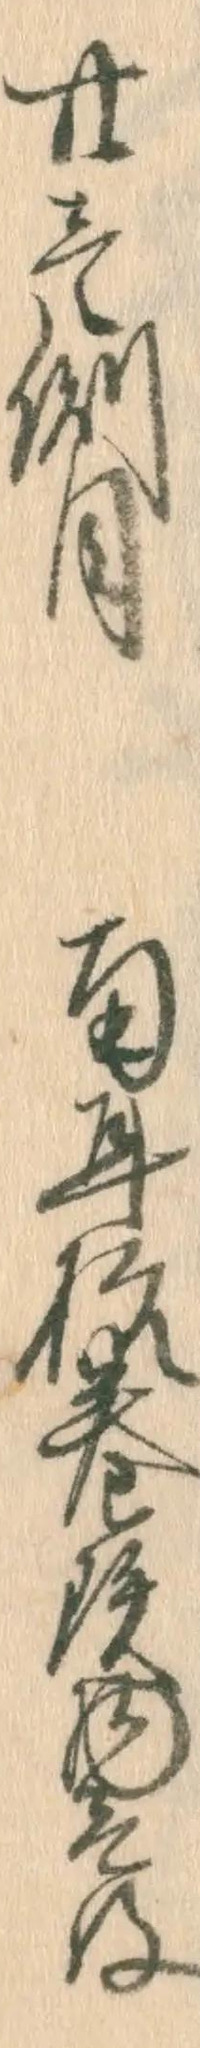廿壱側目南耳杭巻鉄物壱枚
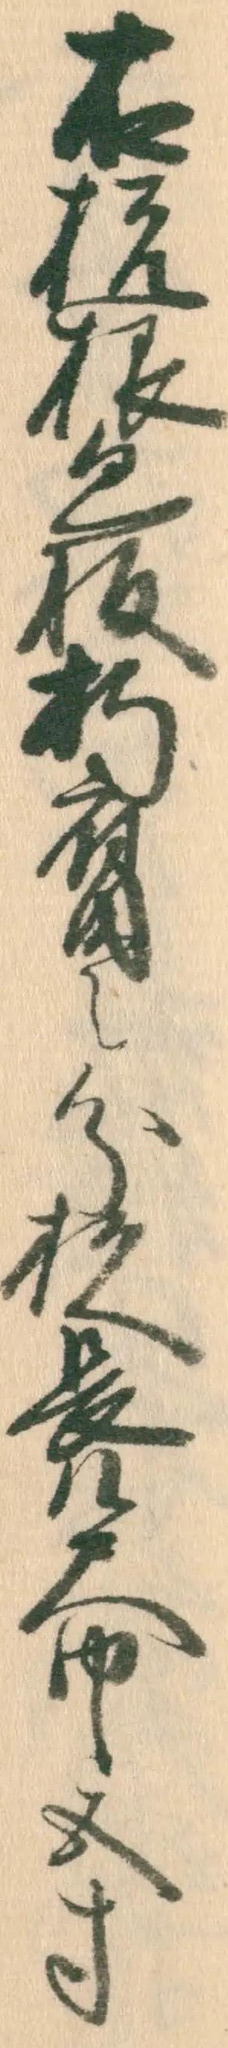右杭根包板朽腐之分杉長八尺巾五寸
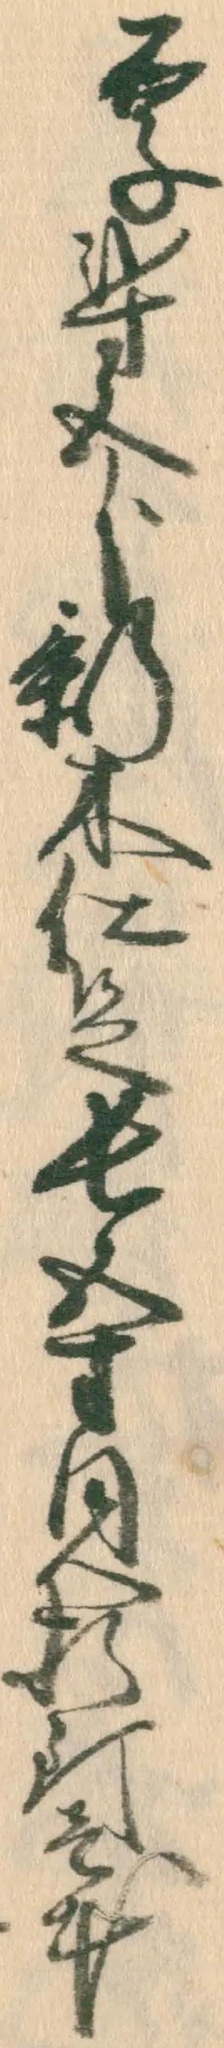厚弐寸五分之新木仕足長五寸貝折釘壱本
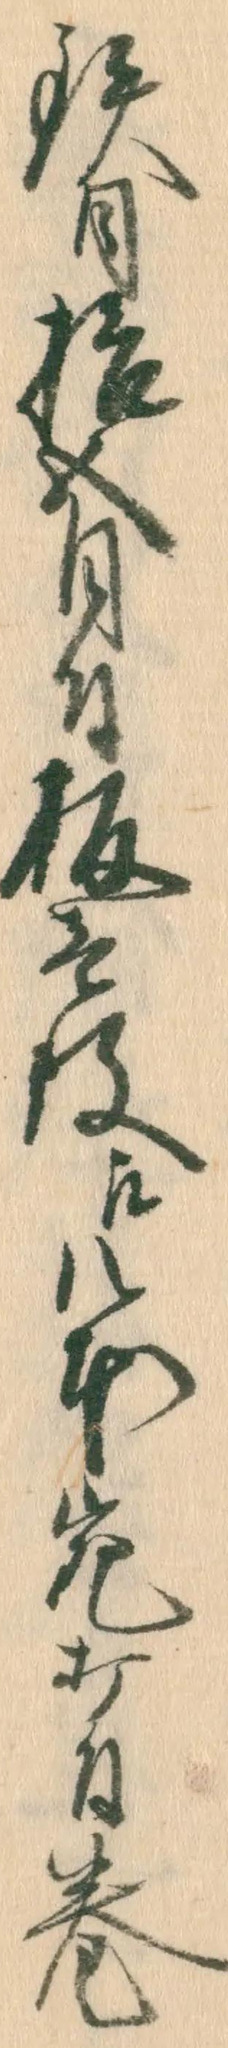鉄目拾五目付板壱枚え八本宛打付巻
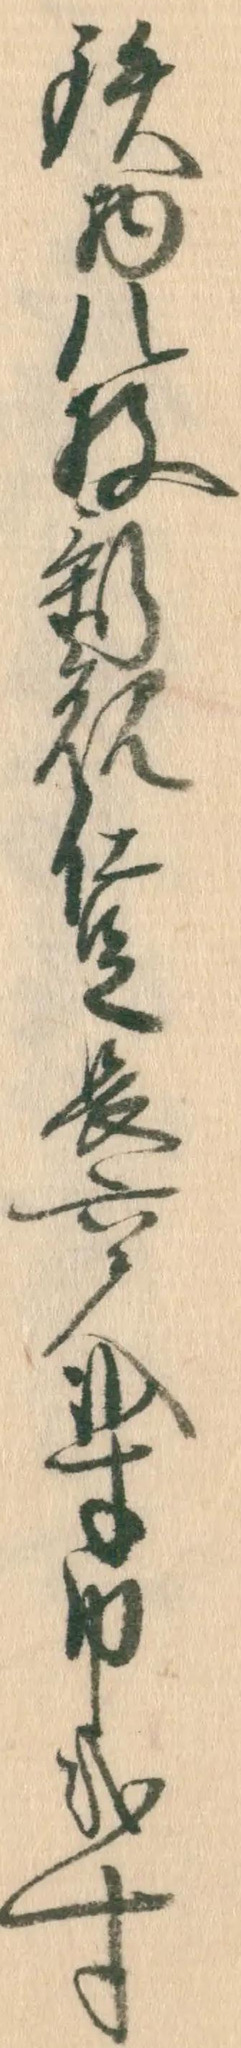鉄物八枚新規仕足長六尺弐寸巾弐寸
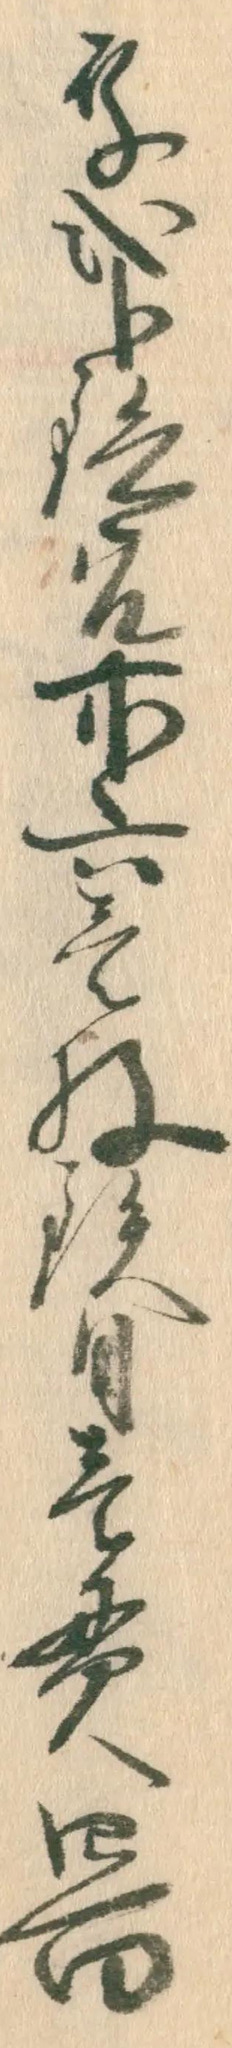厚弐分鋲穴廿六壱枚鉄目壱貫四百
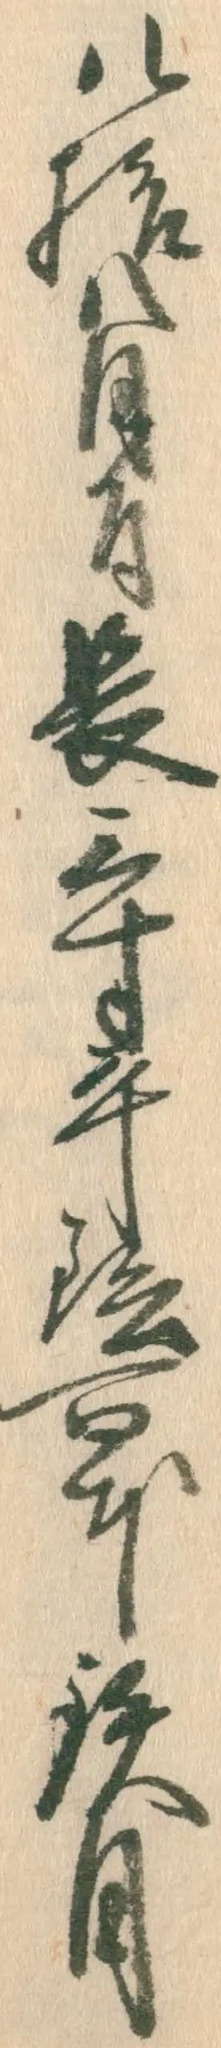八拾八目付長三寸平鋲百本鉄目

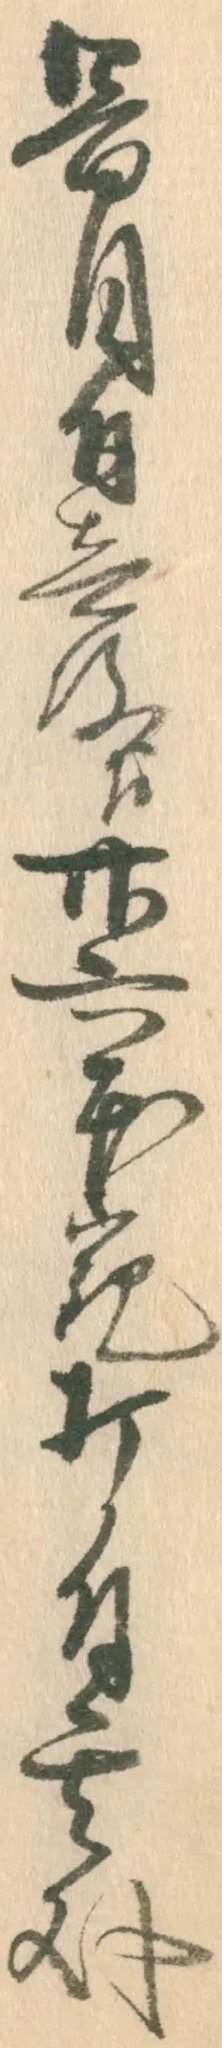四百目付壱枚え廿六本宛打付其外
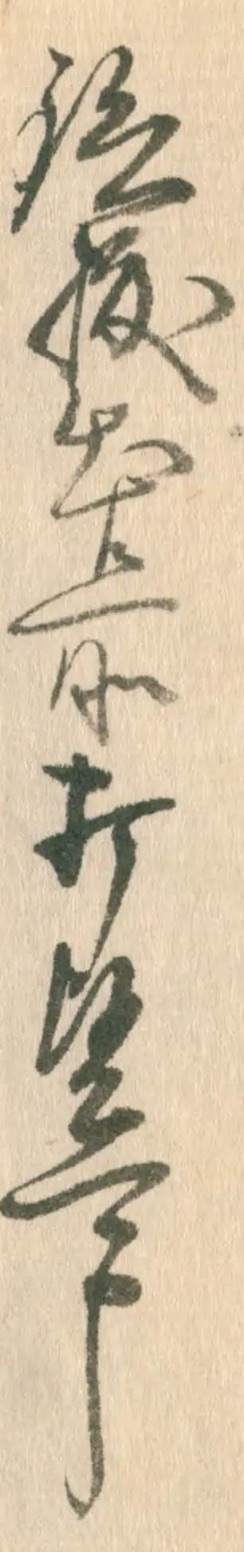鋲抜出候所打堅可申
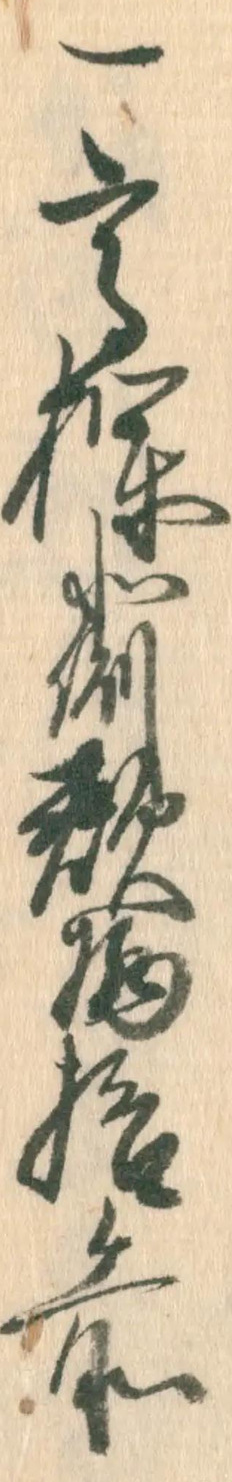一高欄北側頬柄拾ケ所
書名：三橋 17巻. [8] 三橋小破御修復書留　但御奉行御掛リ替地震潰橋番屋　嘉永四亥年より安政二卯年迄　下
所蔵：国立国会図書館 National Diet Library, JAPAN
